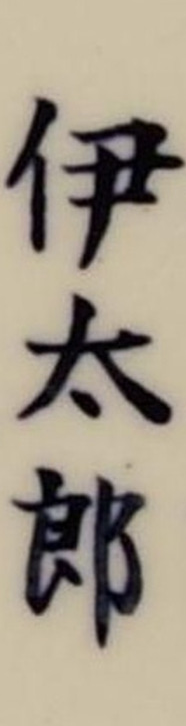伊太郎
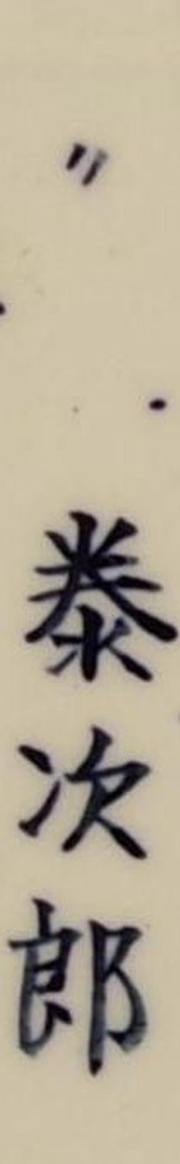泰次郎
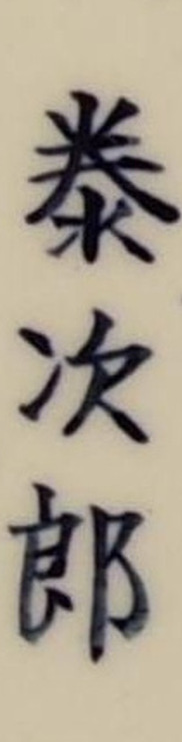泰次郎
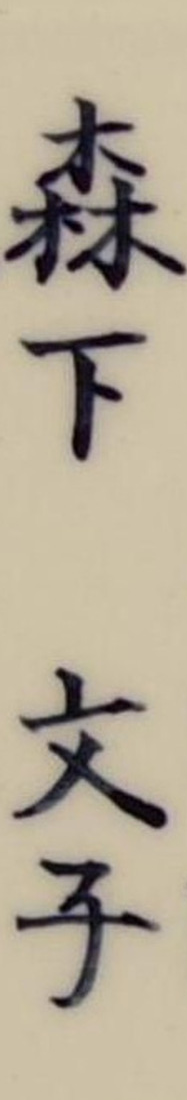森下文子
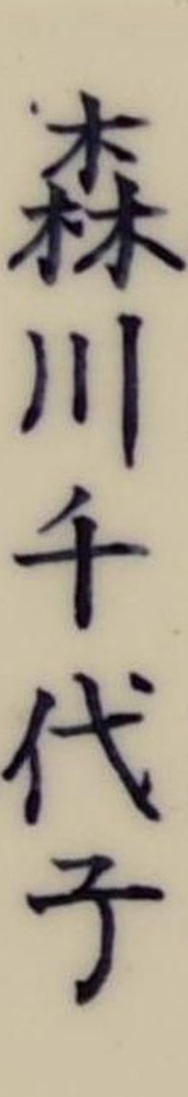森川千代子
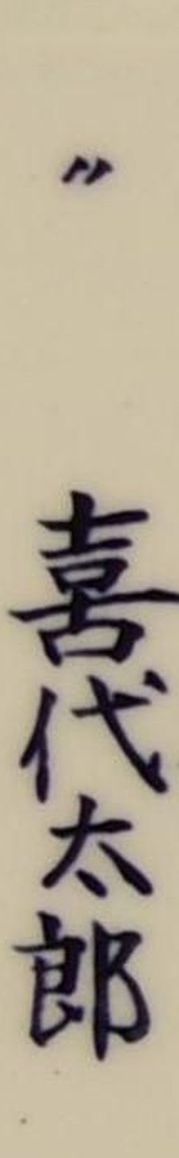喜代太郎
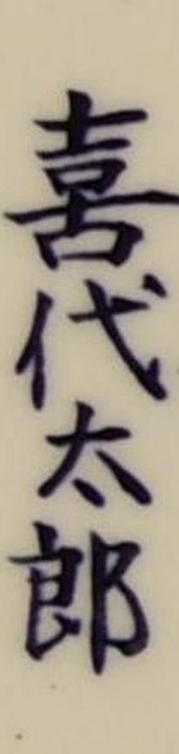喜代太郎
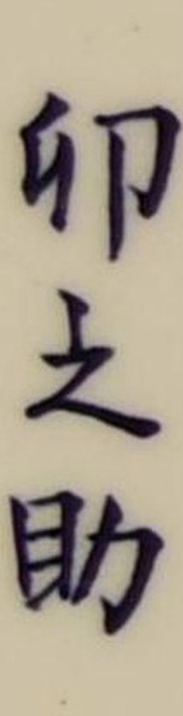卯之助
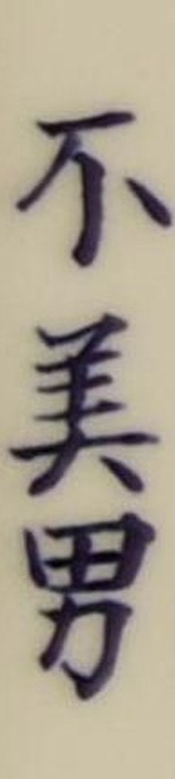不美男

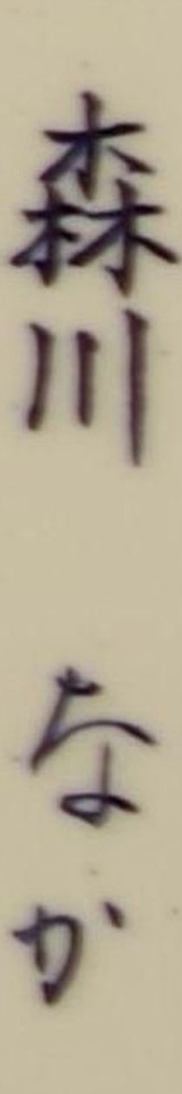森川なか
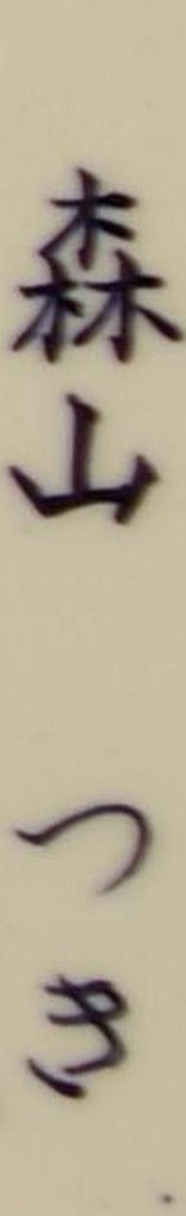森山つき
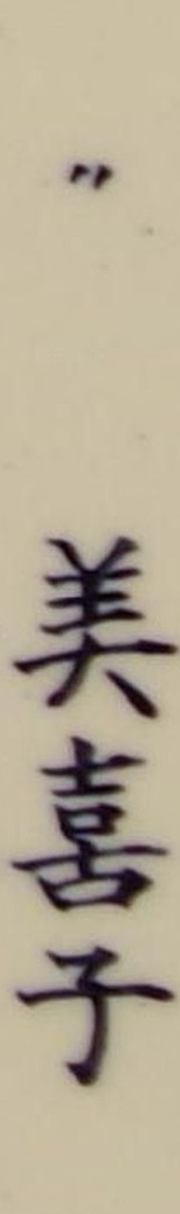美喜子
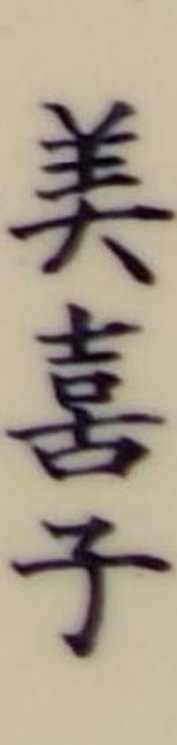美喜子
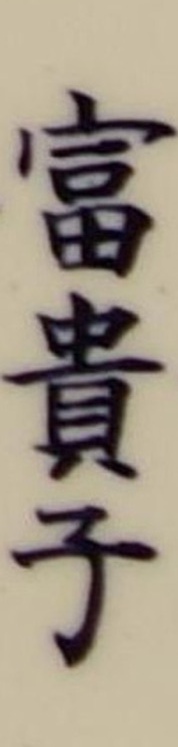富貴子
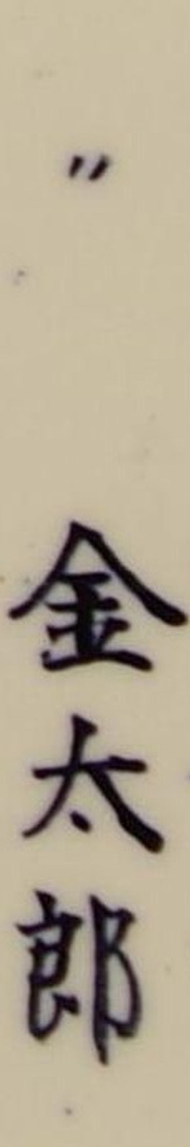金太郎
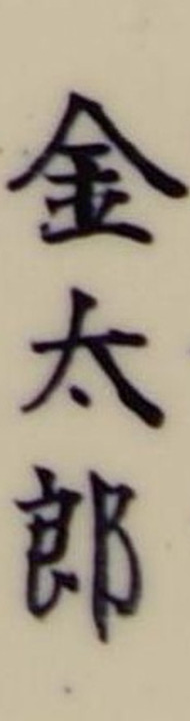金太郎
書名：A~D
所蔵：koyasan kongobuji
